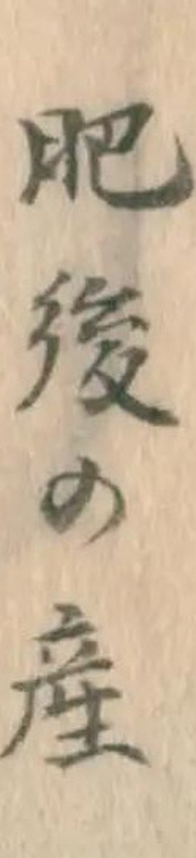肥後の産
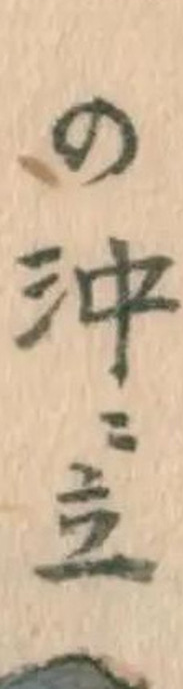の沖に立
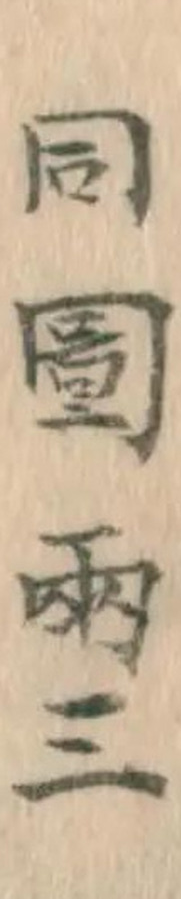同図両三
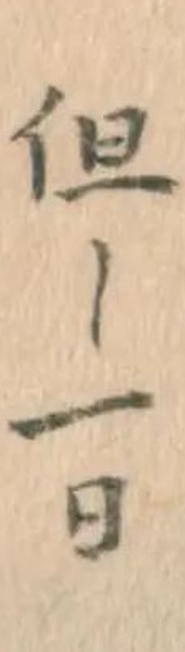但し一日
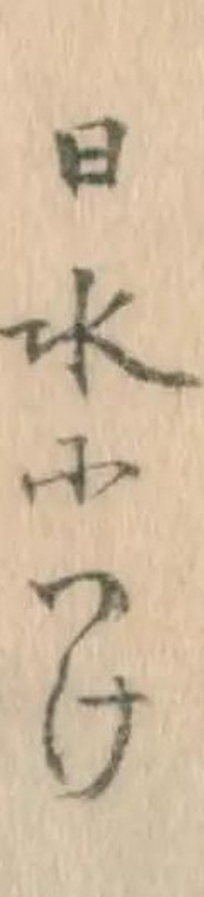日水につけ
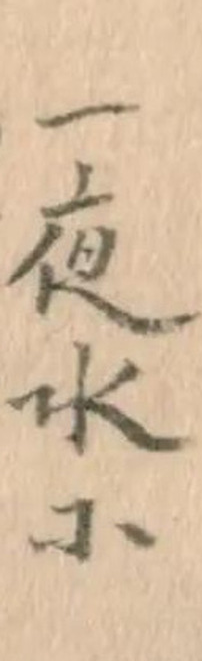一夜水に
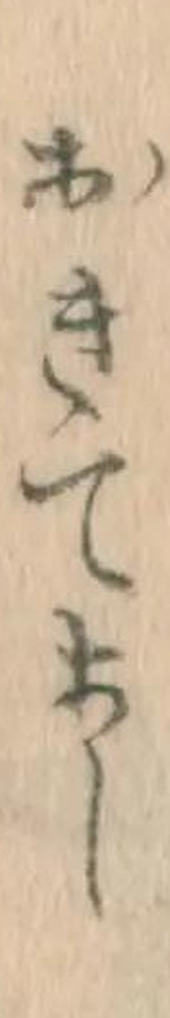おきてよし
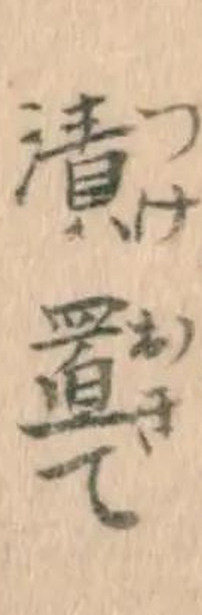漬置て
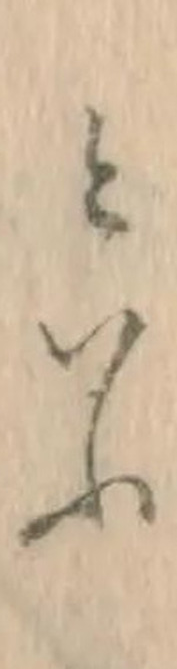といふ
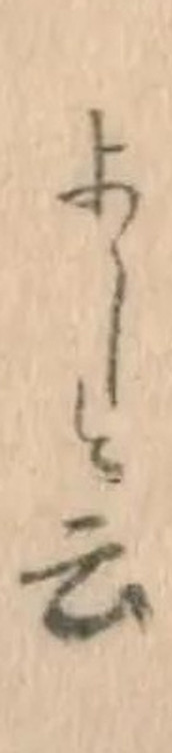よしと云
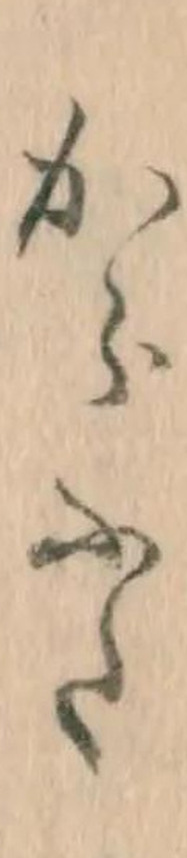からふた
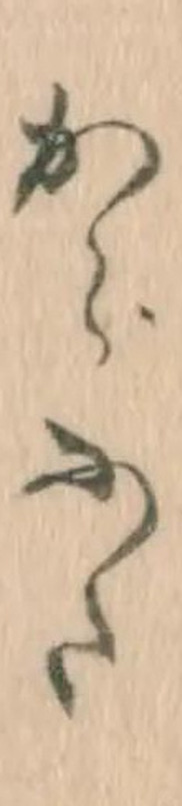からふた

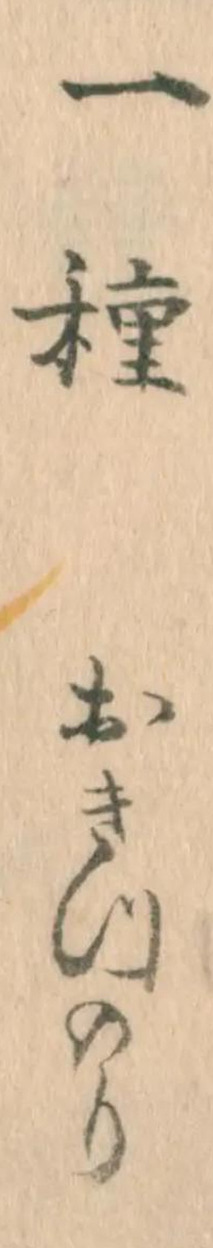一種おきつのり
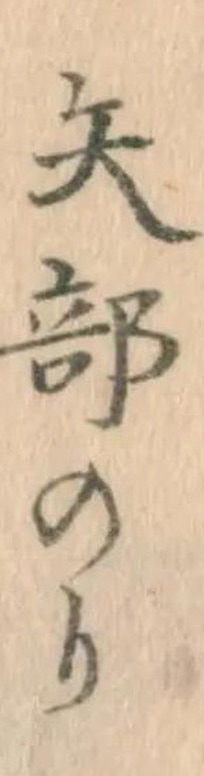矢部のり
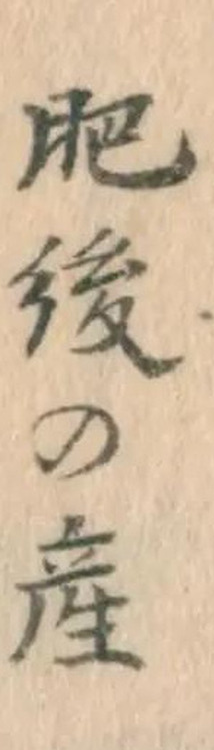肥後の産
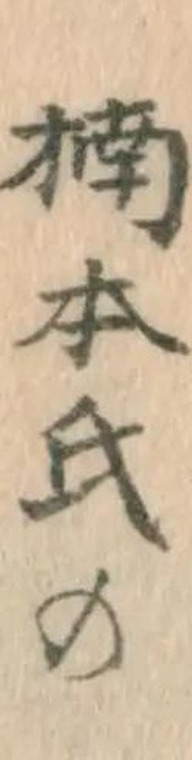楠本氏の
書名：本草図譜. 巻52-54
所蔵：国立国会図書館 National Diet Library, JAPAN
